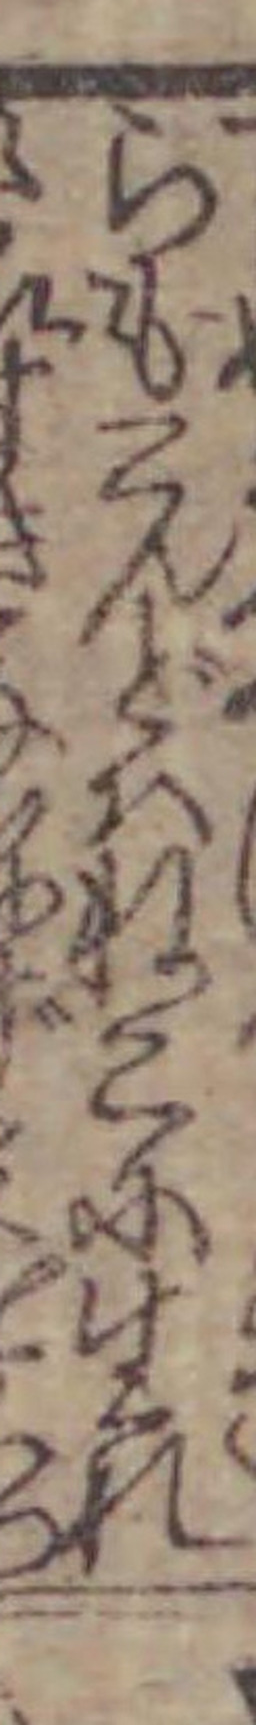らもこんどはねとに生れ
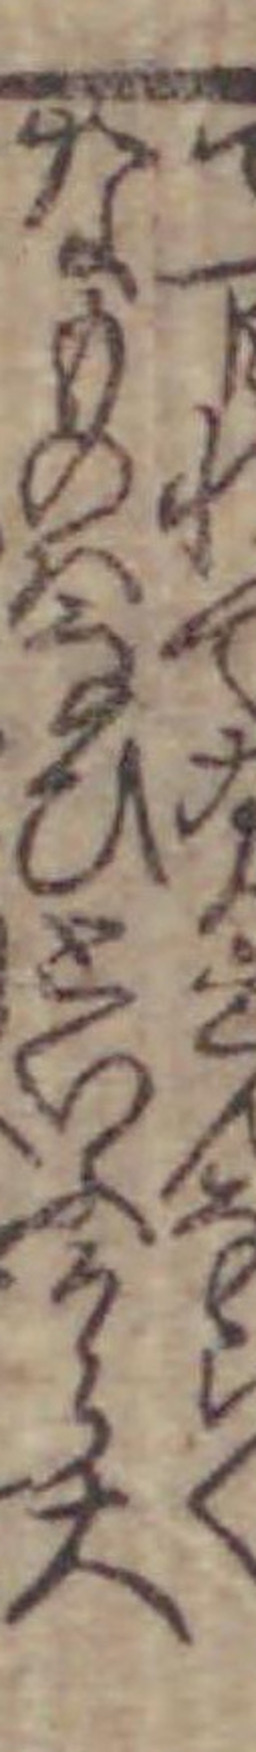なものはなひちふから大
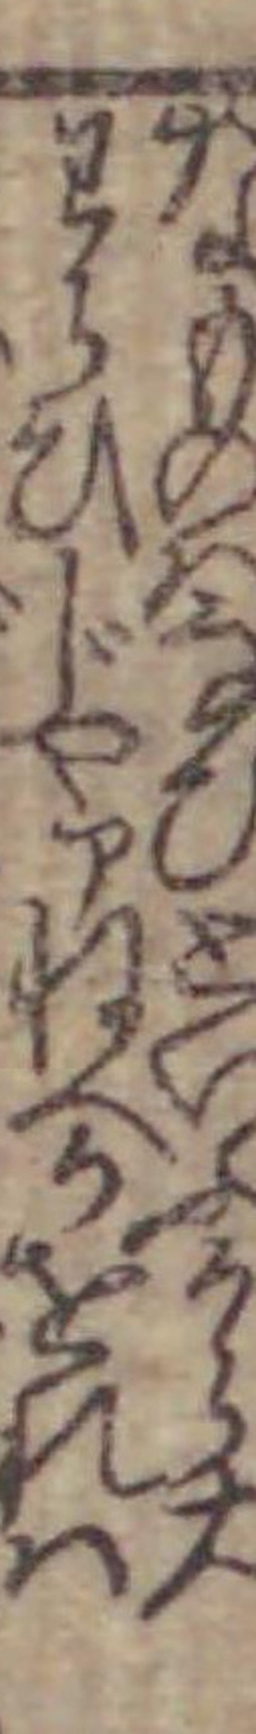わらひじやァねへかをれは
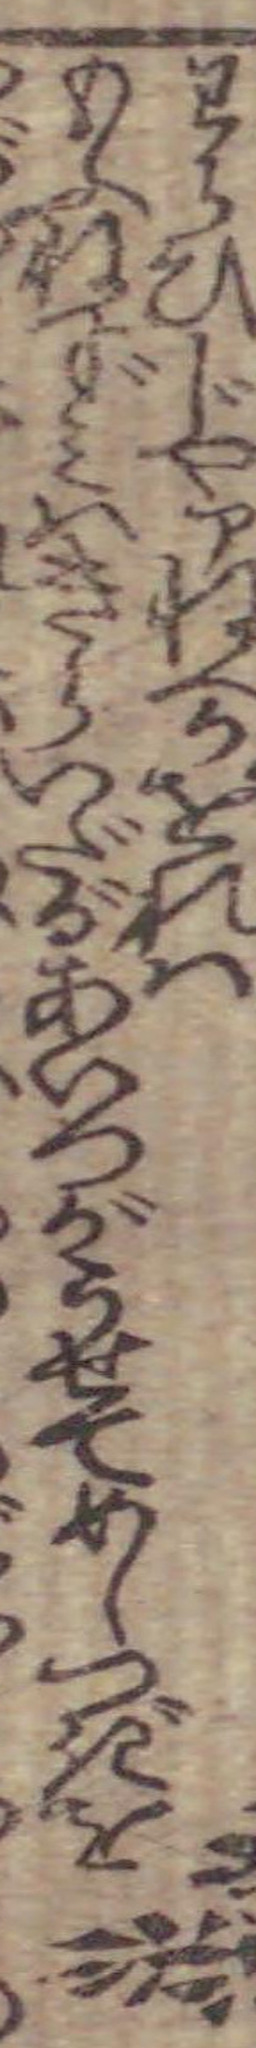もふねずみはきらいだがあいつがうせてめしつぎを
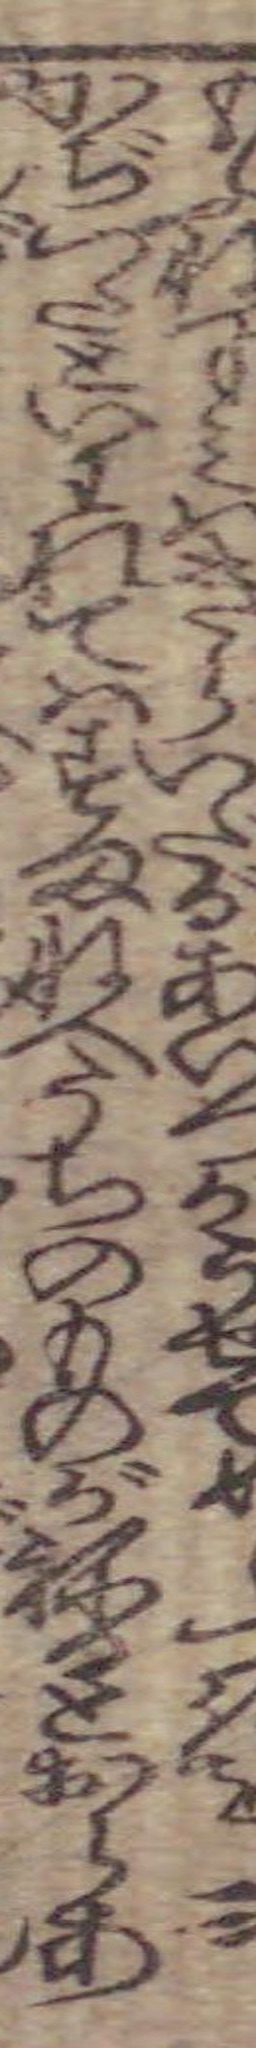かぢつたといわれてはすまねへうちのものがねるとおらあ
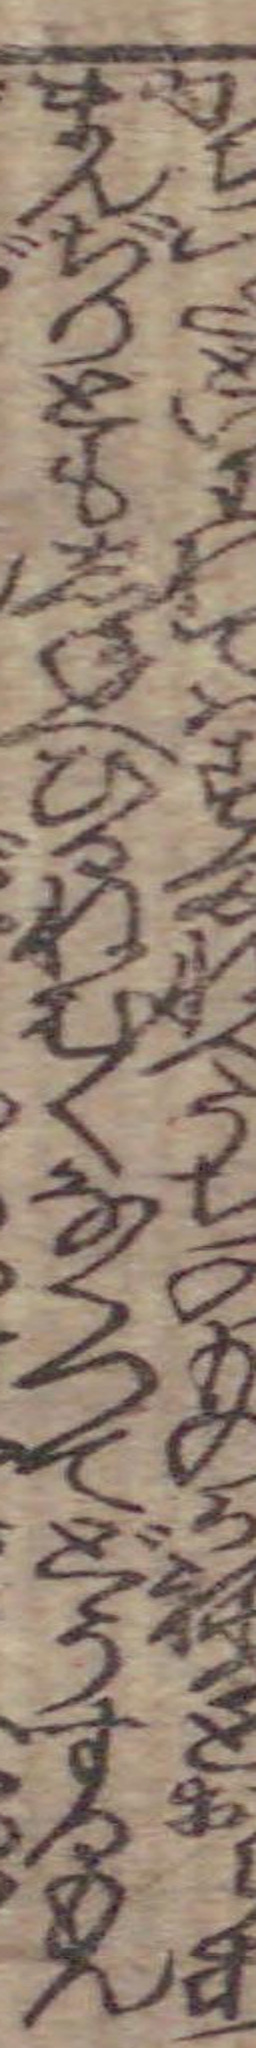まんぢりともしねへひるねむくなくつてどうするもん
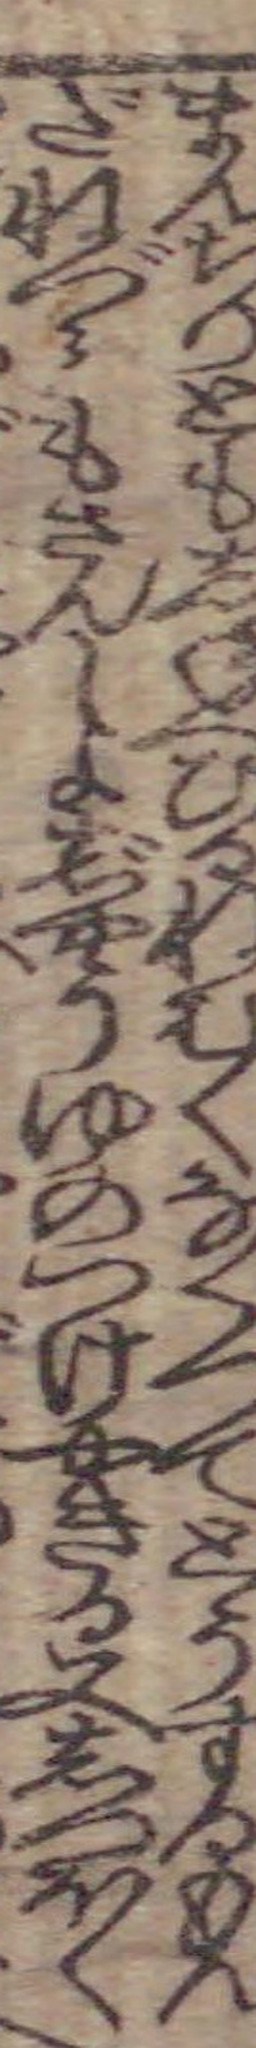だねづみもさんしよじやうゆのつけやきか又しつほく
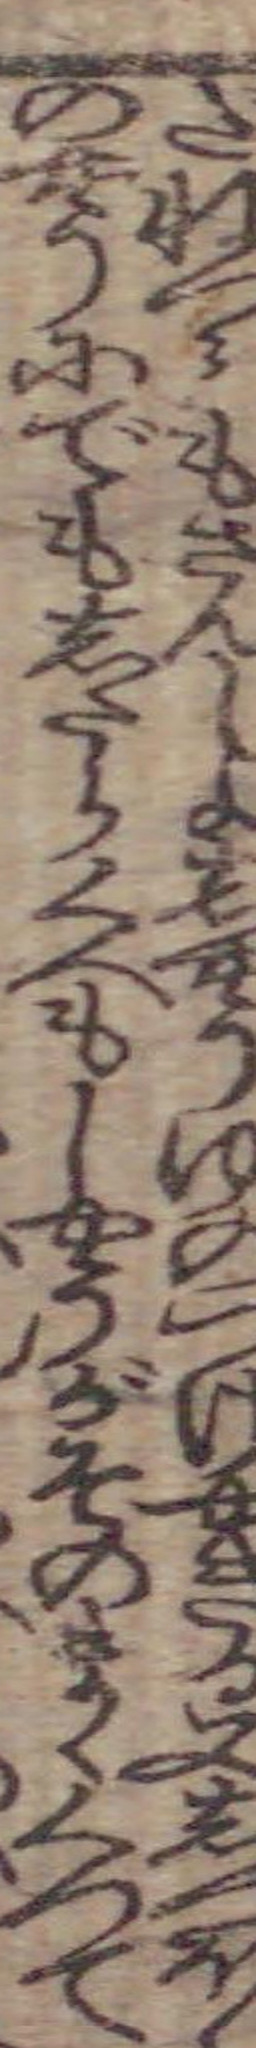のうにでもしたらくへもしやうがそのまゝくつて
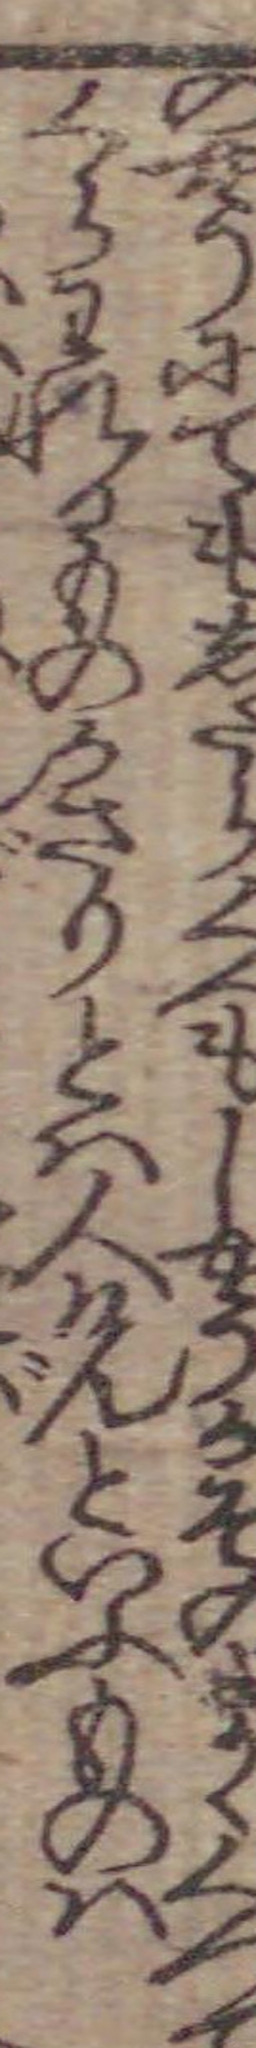くらわれるものかさりとは人けんといふものは
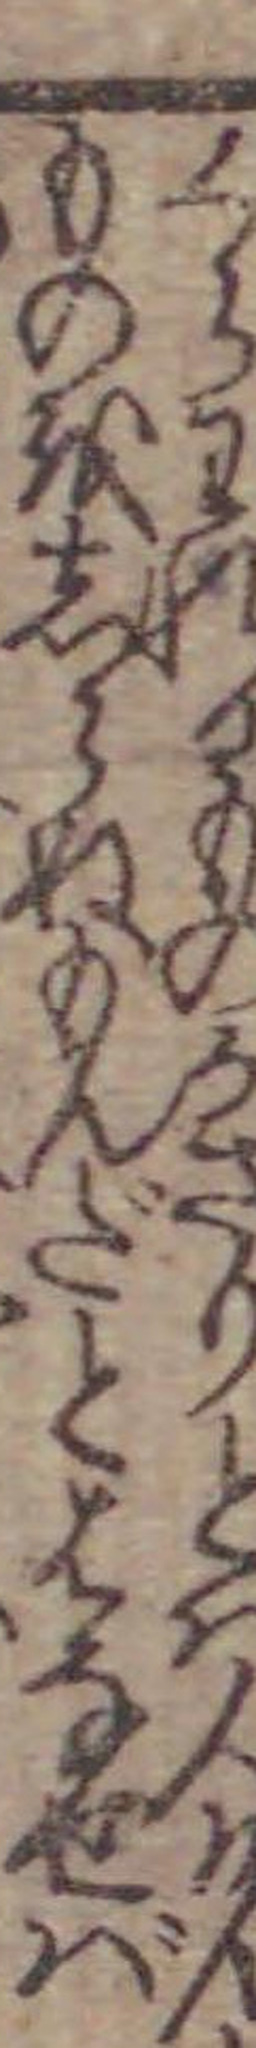ものをしらぬもんだとはなせば
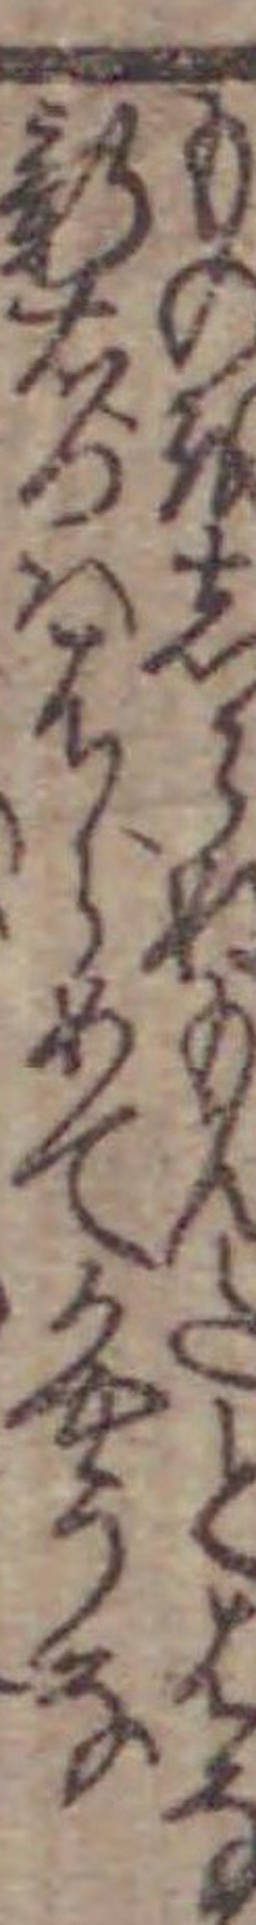新右衛門ははら？めてかやうな
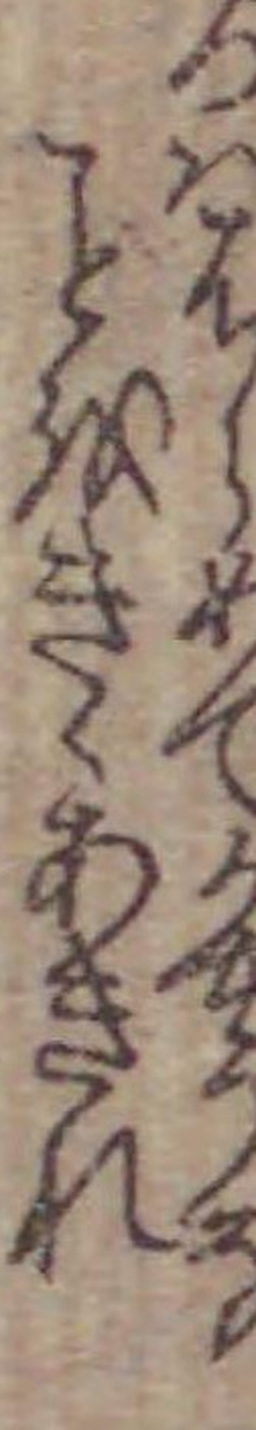ことをきゝあきれ
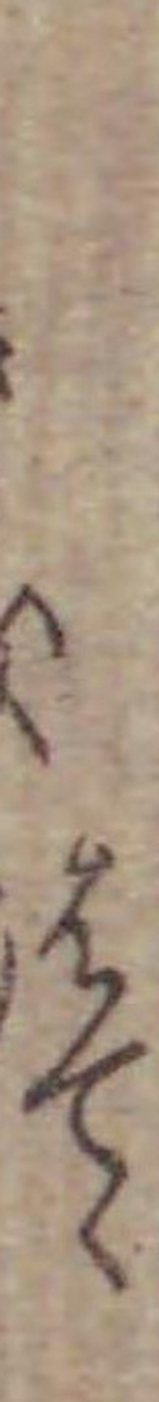はてて
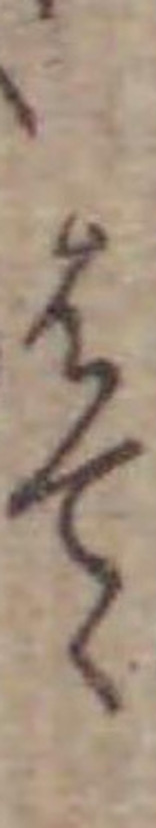はてて
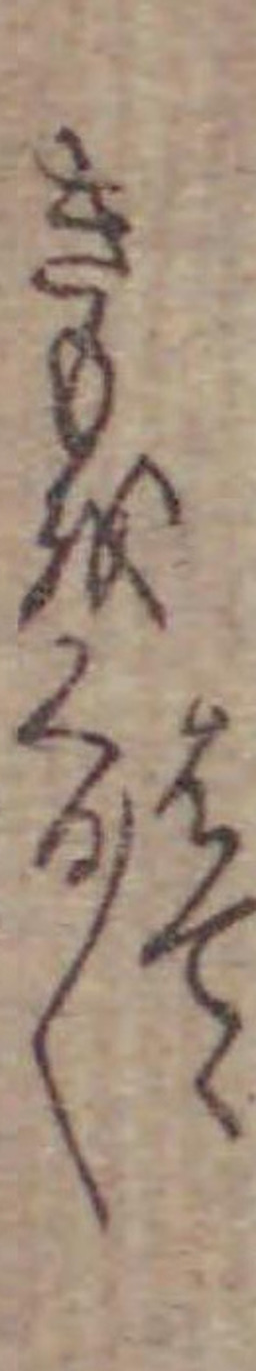きもをくる〳〵
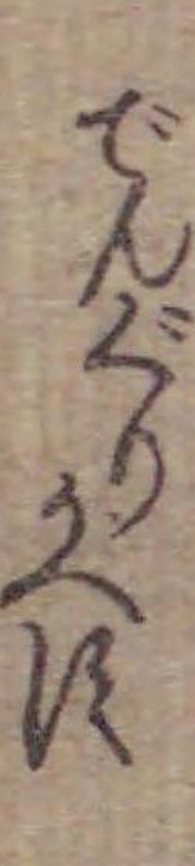でんぐりかへす
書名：即席耳学問 : 3巻
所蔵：国立国会図書館 National Diet Library, JAPAN
